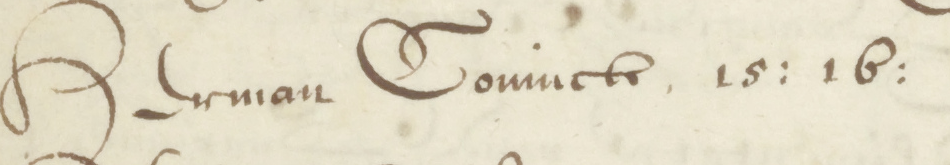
Herman Coninck, 15: 16:
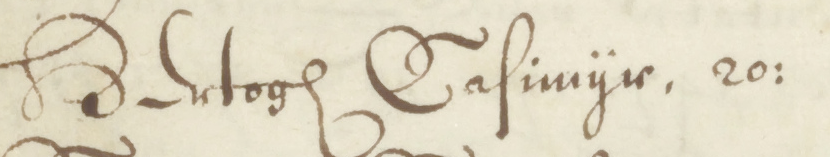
Hertogh Casimijr, 20:
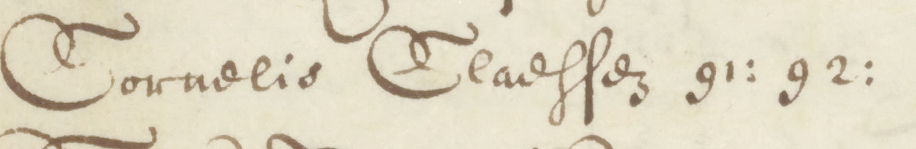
Cornelis Claessen 91: 92:
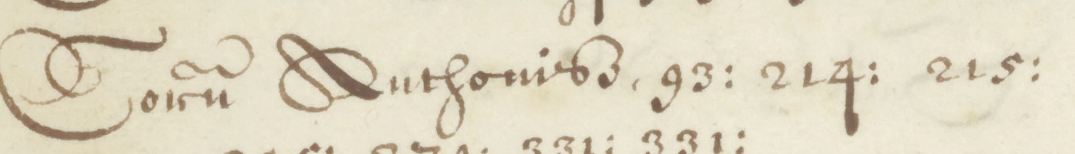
Corn Anthonisz, 93: 214: 215:
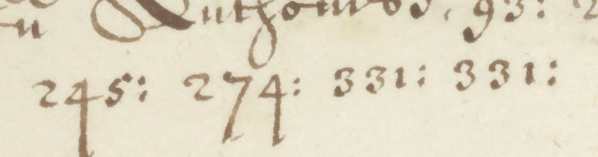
245: 274: 331: 331:
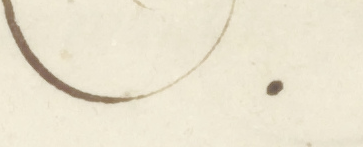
C.
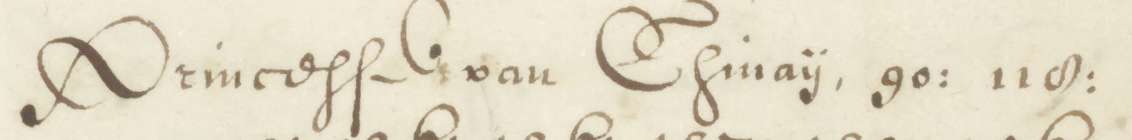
Princesse van Chinaij, 90: 118:
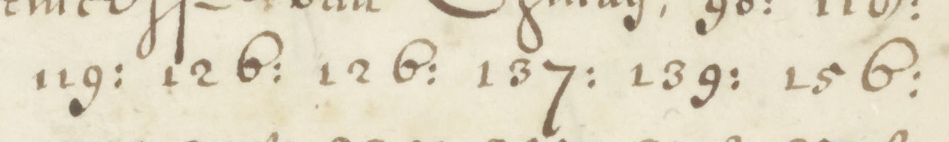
119: 126: 126: 137: 139: 156:
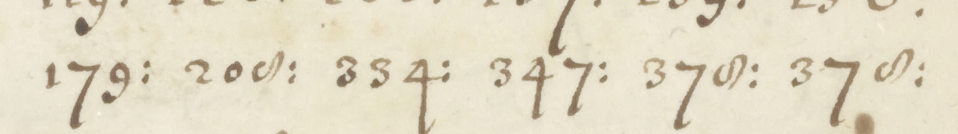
179: 208: 334: 347: 378: 378:
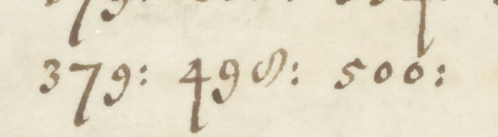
379: 498: 500:
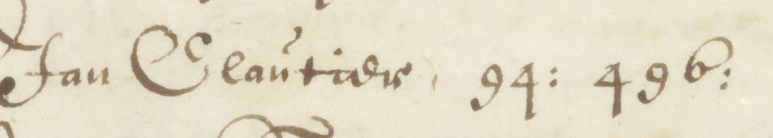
Jan Clautier, 94: 496:
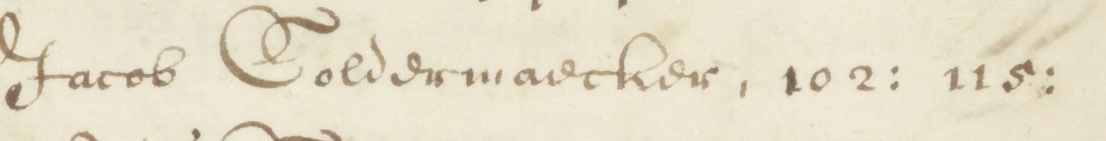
Jacob Coldermaecker, 102: 115:
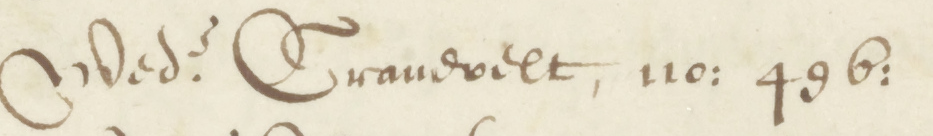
Wede. Cranevelt, 110: 496:
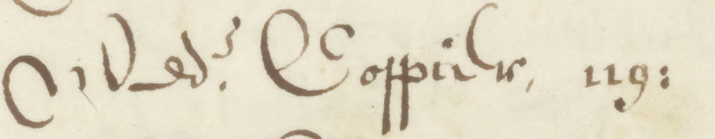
Wede. Coppier, 119:
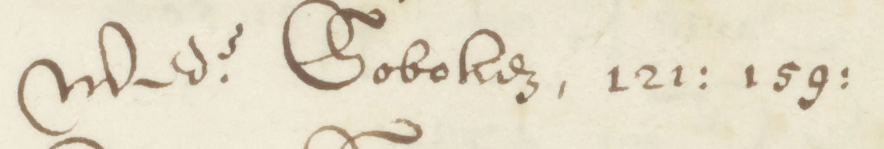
Wede. Coboken, 121: 159:
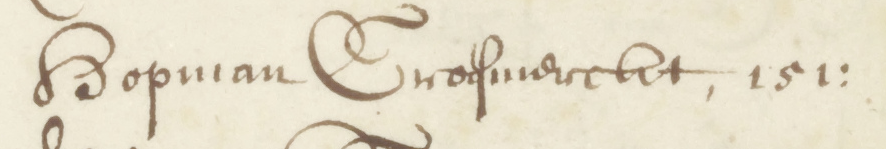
Hopman Cratsmerckt, 151:
